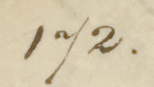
172.
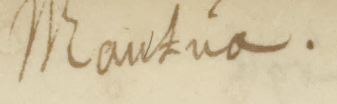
Mantua
